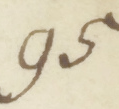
95
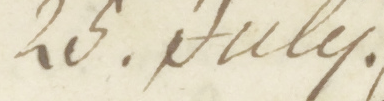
25. Julij.
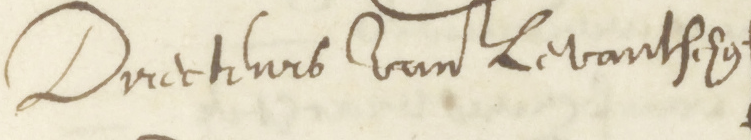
Directeurs van Levantschen
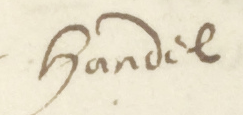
handel
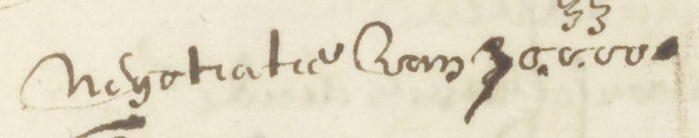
negotiatie van 70.000.
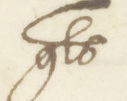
gls
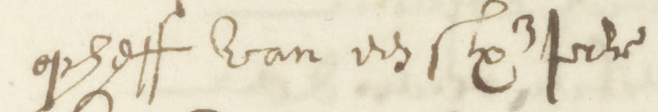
opheff van een ?x per
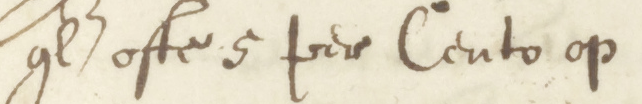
gl ofte 5 per Cento op
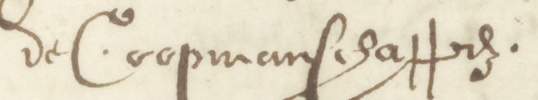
de Coopmanschappen.
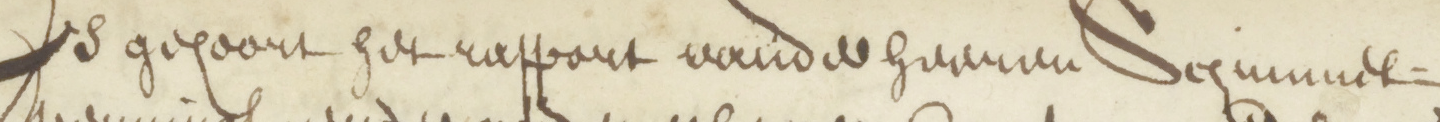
Is gehoort het rapport vande heeren Schimmel=
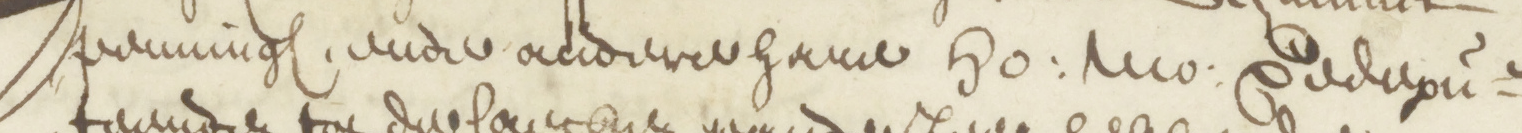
penningh, ende andere hare Ho:Mo: Gedepu -
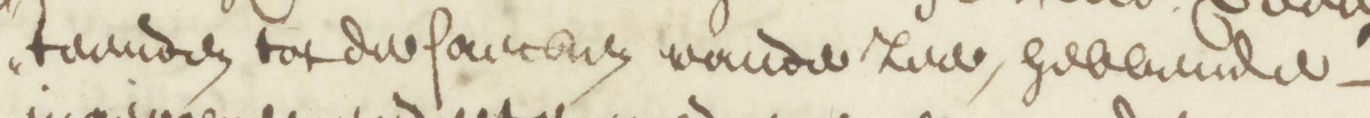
teerden tot de saecken vande Zee, hebbende —
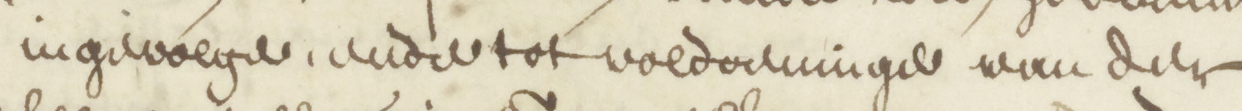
ingevolge, ende tot voldoeninge van der
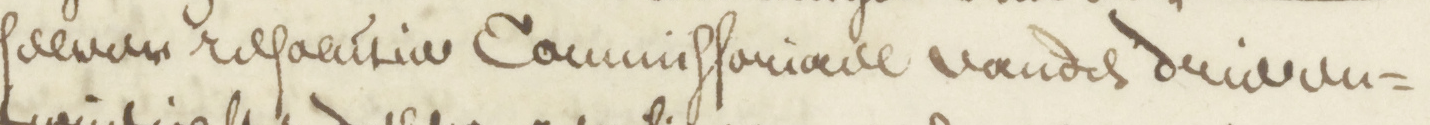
selver resolutie Commissoriael vanden drie en=
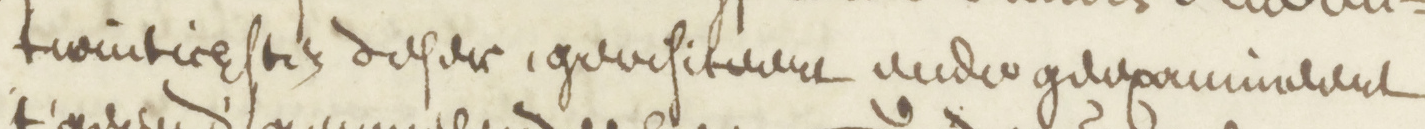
twintichsten deser, gevisiteert ende geexamineert
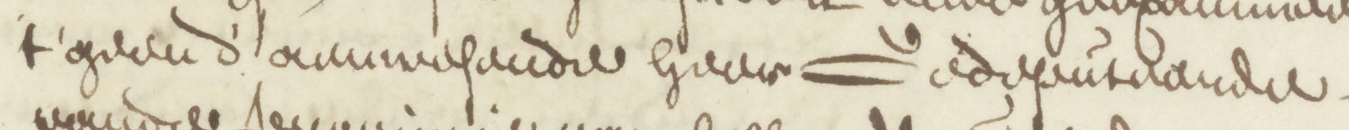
t'geen d'aenwesende heer Gedeputeerde —
